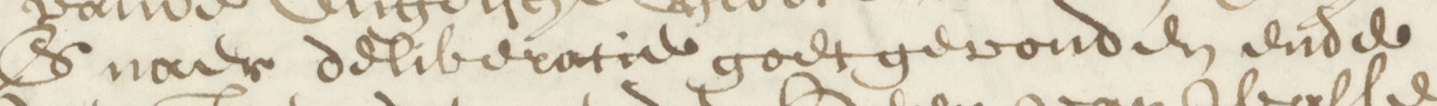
Is naer deliberatie goetgevonden ende
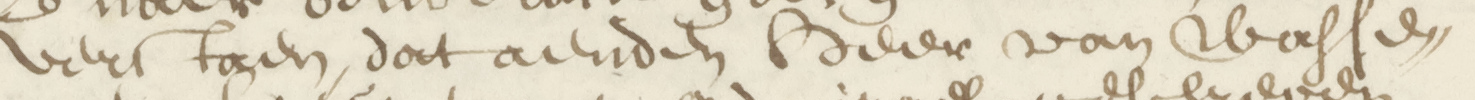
verstaen, dat aenden Heer van Wasse„
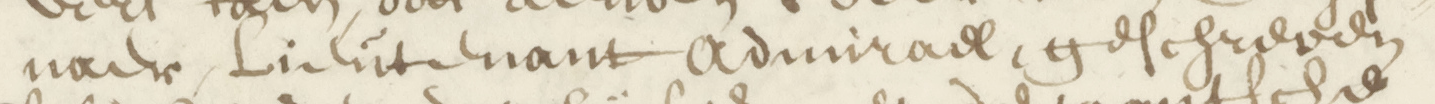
naer, Lieutenant Admirael, geschreven
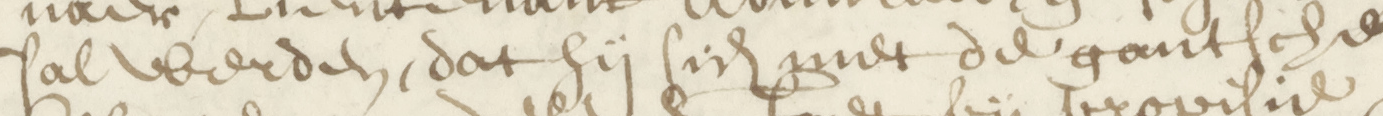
sal werden, dat hij sich met de gantsche
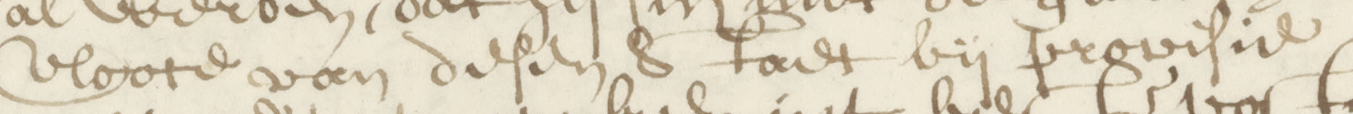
Vloote van desen Staet bij provisie
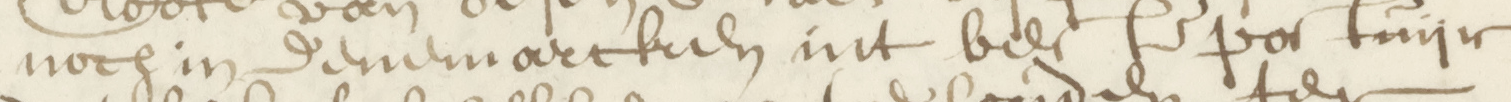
noch in Denemarcken int beste postuijr
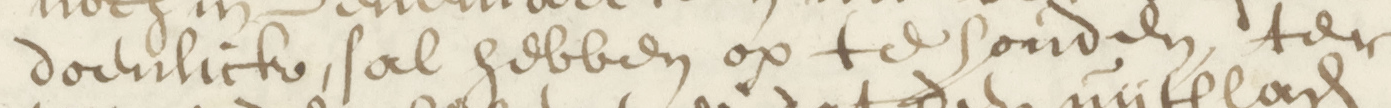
doenlick, sal hebben op te houden, ter
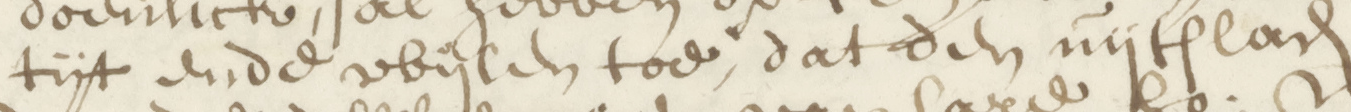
tijt ende wijlen toe, dat den uijtslach
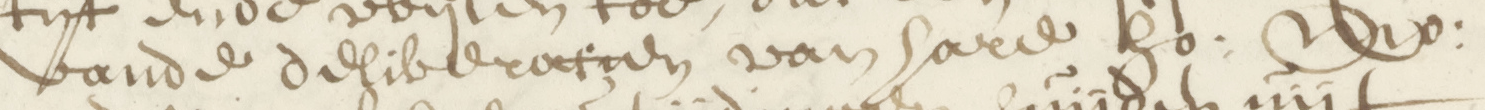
vande deliberatien van hare Ho:Mo:
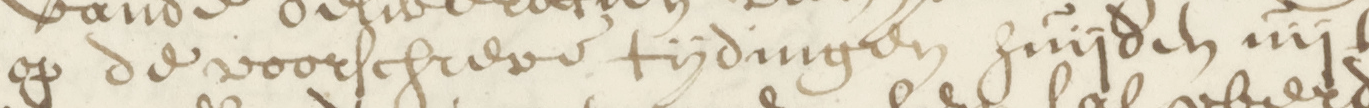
op de voorschreve tijdingen huijden uijt
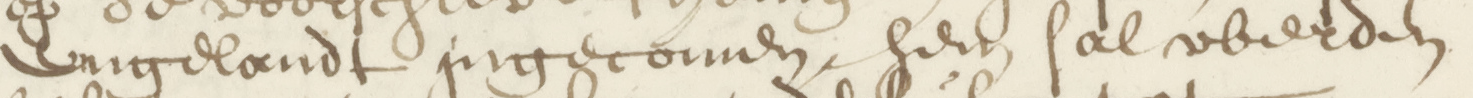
Engelandt ingecomen, hem sal werden
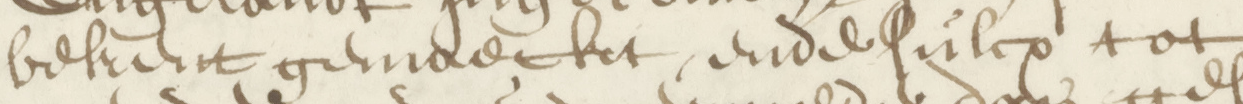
bekent gemaeckt, ende sulcx tot
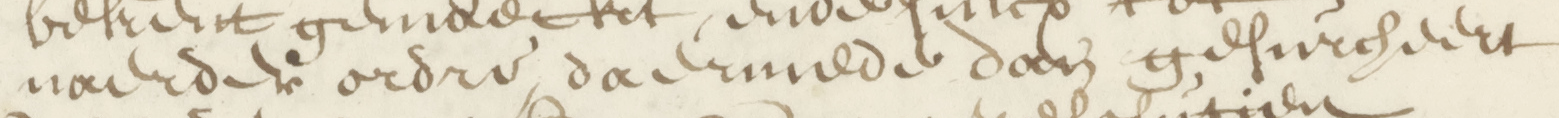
naerder ordre daermede dan gesurcheert
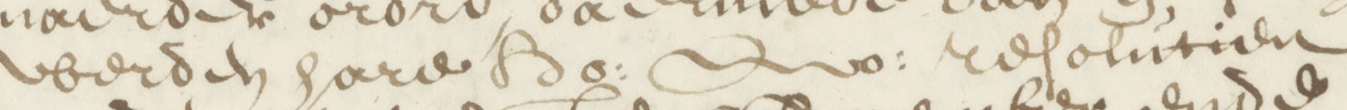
werden hare Ho:Mo: resolutien
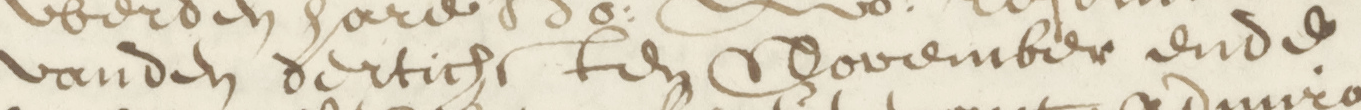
vanden dertichsten November ende
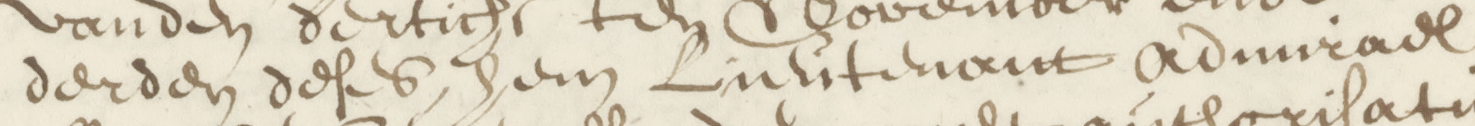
derden deses, hem Lieutenant Admirael
